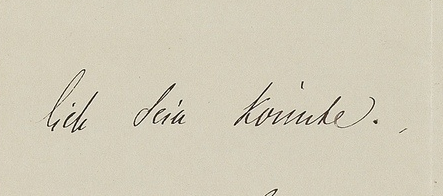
lich sein könnte.
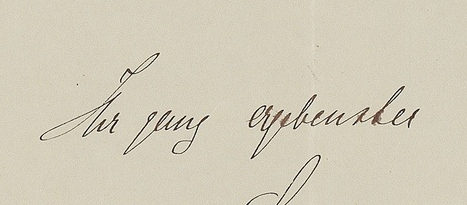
Ihr ganz ergebenster
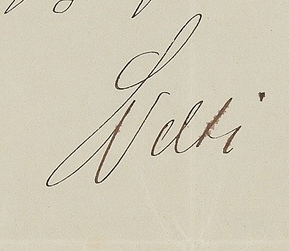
Welti
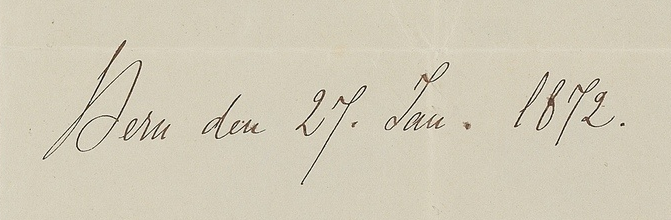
Bern den 27. Jan. 1872.
